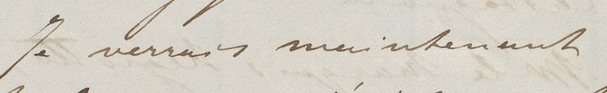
Je verrais maintenant
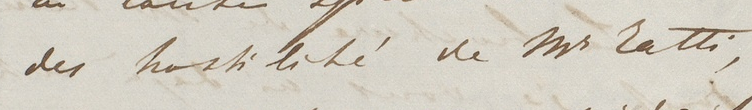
des hostilité de MrTatti,
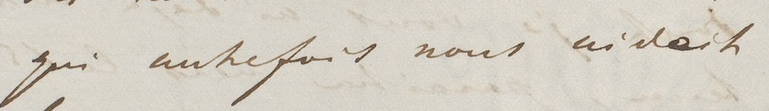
qui autrefois nous aidait
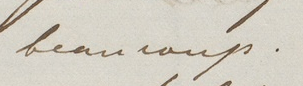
beaucoup.
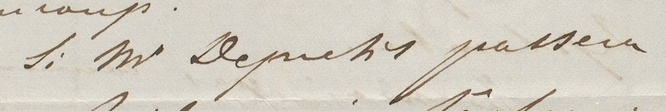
Si MrDepretis passera
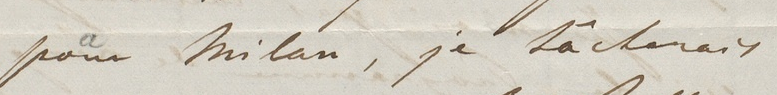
pour Milan, je tâcherais
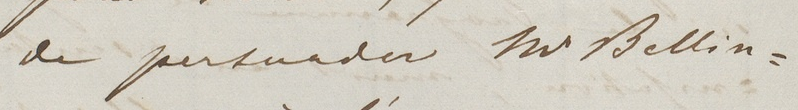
de persuader MrBellin-
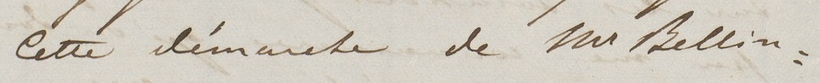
Cette démarche de MrBellin-
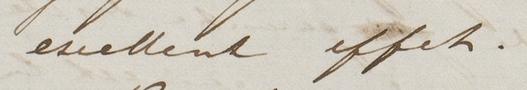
excellent effet.
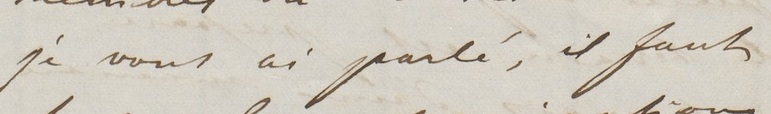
je vous ai parlé, il faut
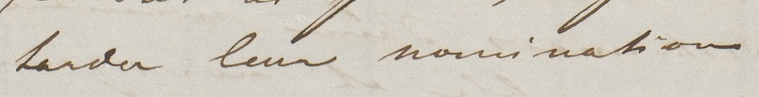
tarder leur nomination
